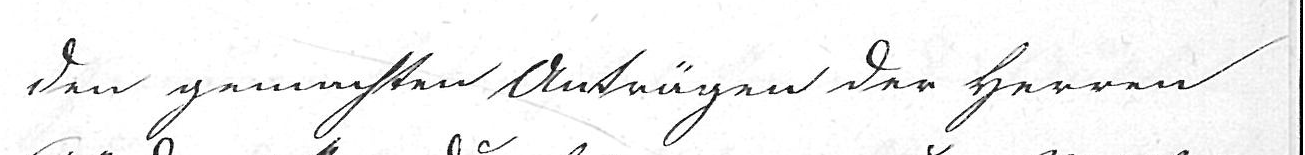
den gemachten Anträgen der Herren
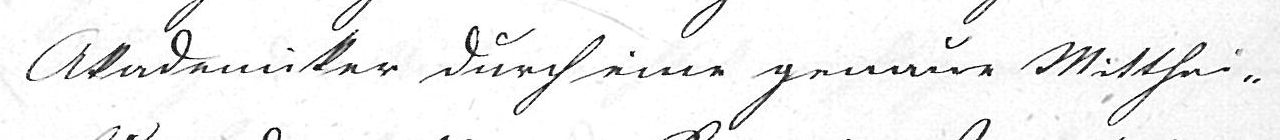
Akademiker durch eine genaue Mitthei-
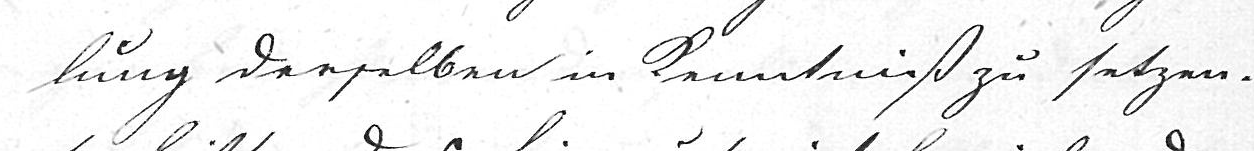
lung derselben in Kenntniß zu setzen.
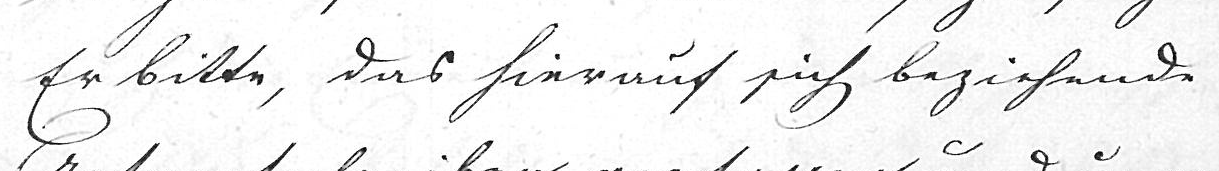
Er bitte, das hierauf sich beziehende
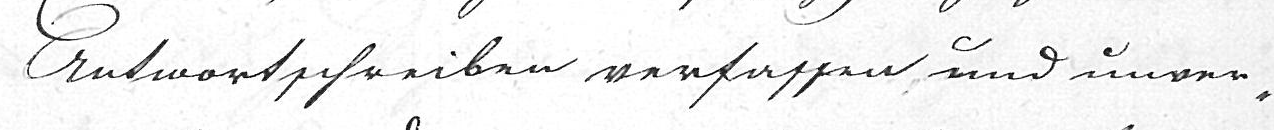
Antwortschreiben verfassen und unver-
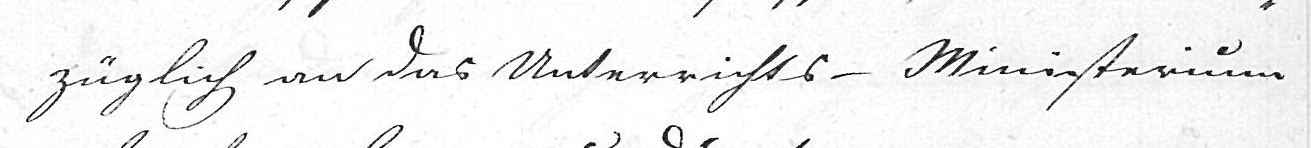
züglich, an das Unterrichts-Ministerium
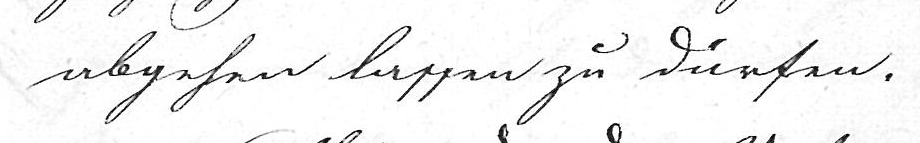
abgehen lassen zu dürfen.
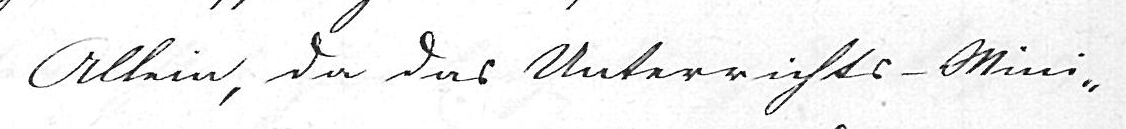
Allein, da das Unterrichts-Mini-
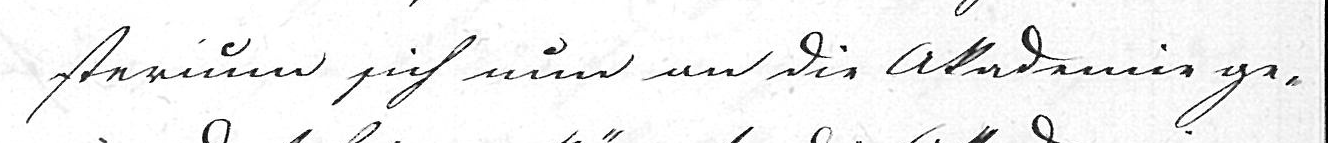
sterium sich nun an die Akademie ge-
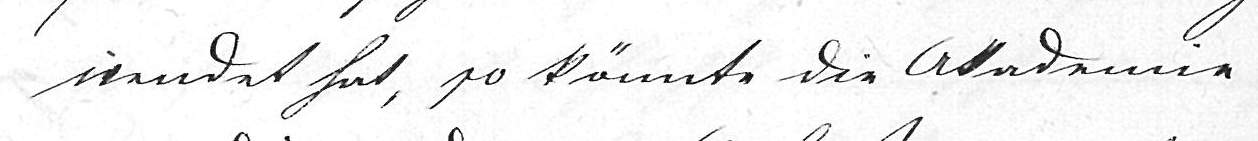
wendet hat, so könnte die Akademie
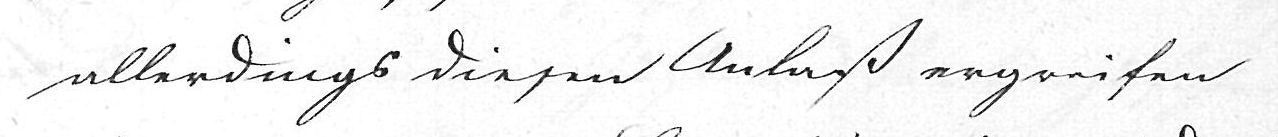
allerdings diesen Anlaß ergreifen
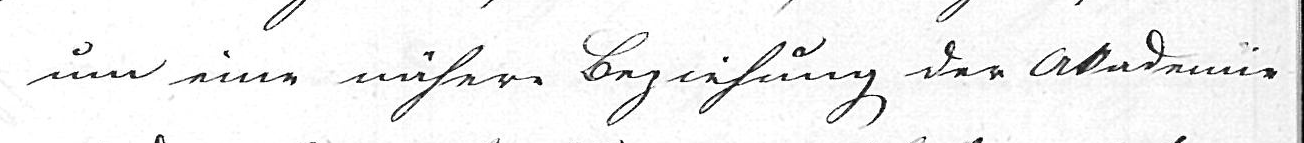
um eine nähere Beziehung der Akademie
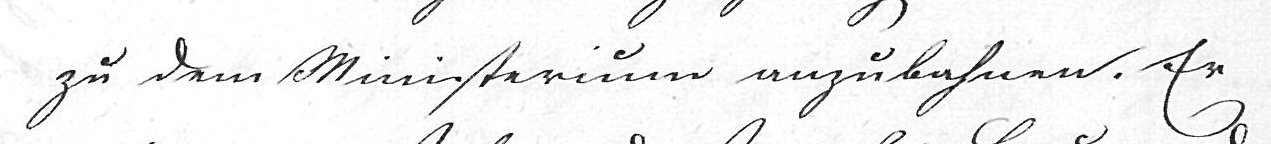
zu dem Ministerium anzubahnen. Er
